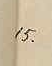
15.
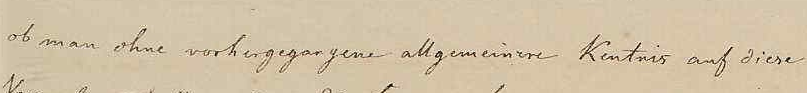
ob man ohne vorhergegangene allgemeine Kentnis auf diese
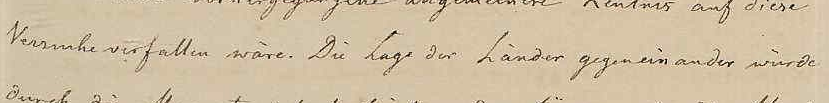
Versuche verfallen wäre. Die Lage der Länder gegeneinander würde
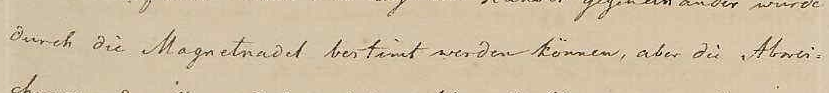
durch die Magnetnadel bestimt werden können, aber die Abwei-
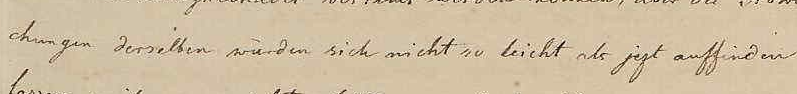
chungen derselben würden sich nicht so leicht als jezt auffinden
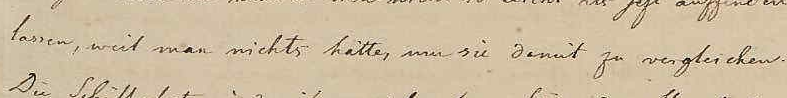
lassen, weil man nichts hätte, um sie damit zu vergleichen.
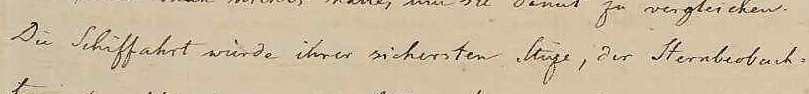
Die Schiffahrt würde ihrer sichersten Stüze, der Sternbeobach-
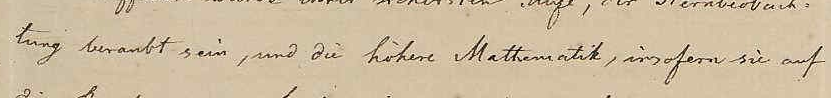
tung beraubt sein, und die höhere Mathematik, insofern sie auf
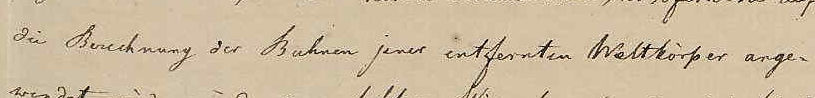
die Berechnung der Bahnen jener entfernten Weltkörper ange-
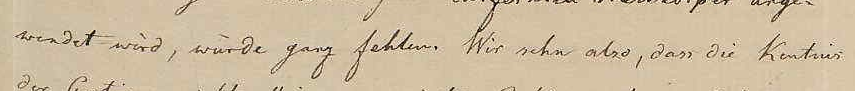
wendet wird, würde ganz fehlen. Wir sehn also, dass die Kentnis
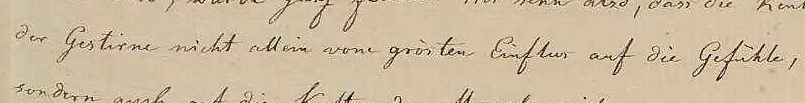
der Gestirne nicht allein vom grösten Einflus auf die Gefühle,
